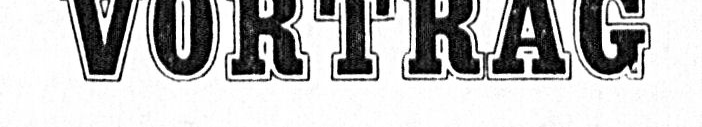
VORTRAG
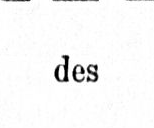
des
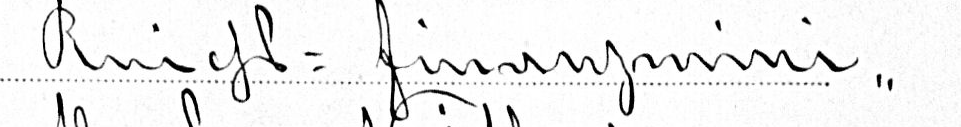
Reichs-Finanzmini¬
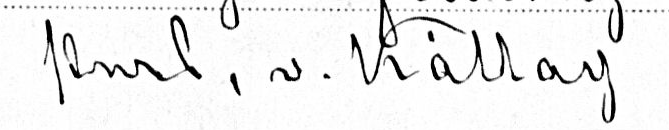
sters, v. Kállay
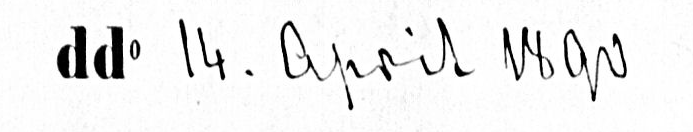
dd° 14. April 1890
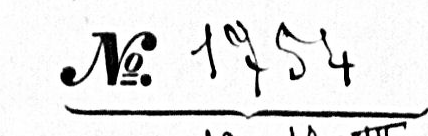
N° 1754
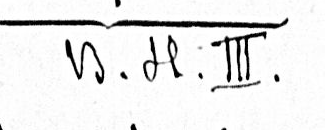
B. H. III.
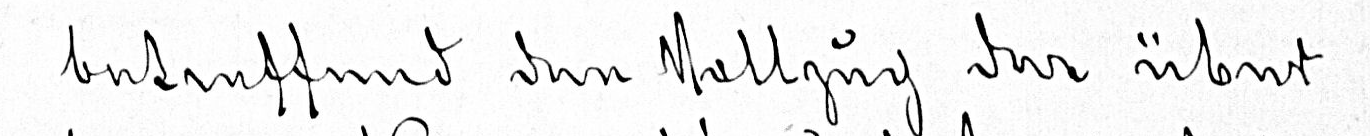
betreffend den Vollzug der über
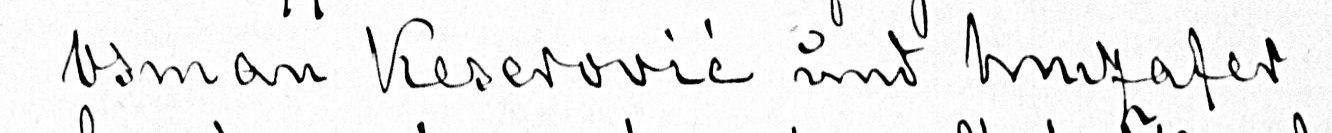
Osman Keserović und xxfer
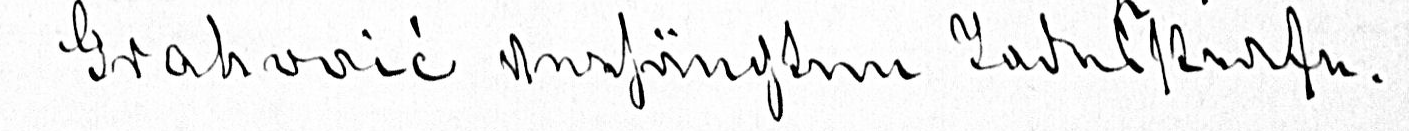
Grahović verhängten Todesstrafe.
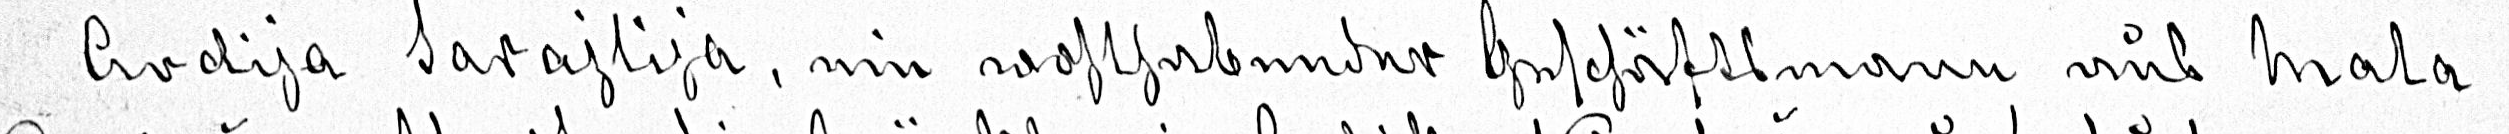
Crodija Savajlija, ein wohlhabender Geschäftsmann aus Mala
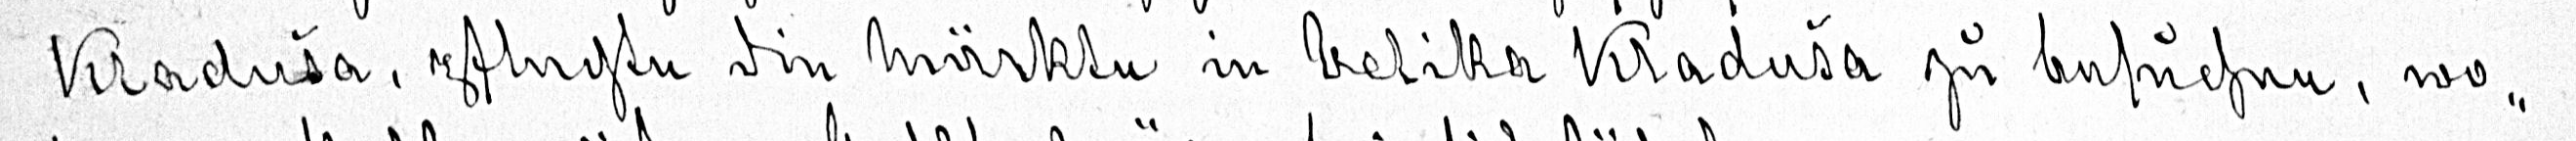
Kladuša, pflegte die Märkte in Velika Kladuša zu besuchen, wo¬
